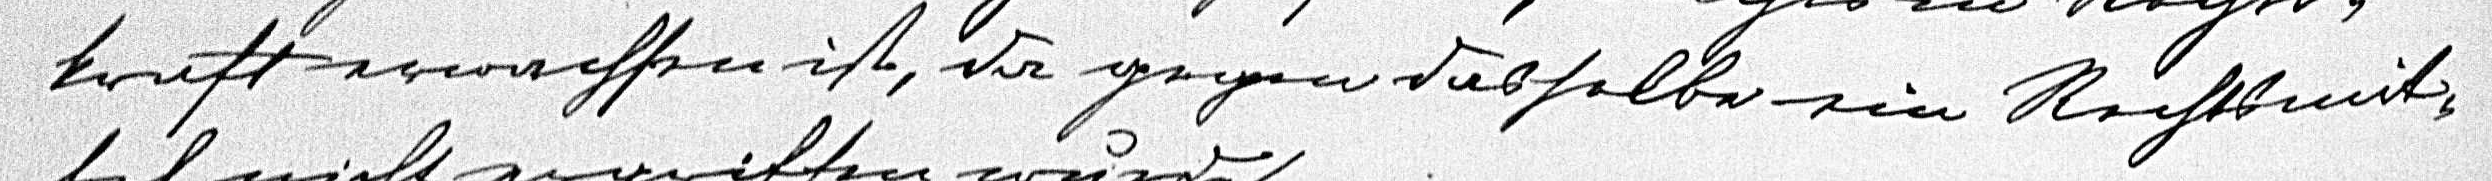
skraft erwachsen ist, da gegen dasselbe ein Rechtsmit¬
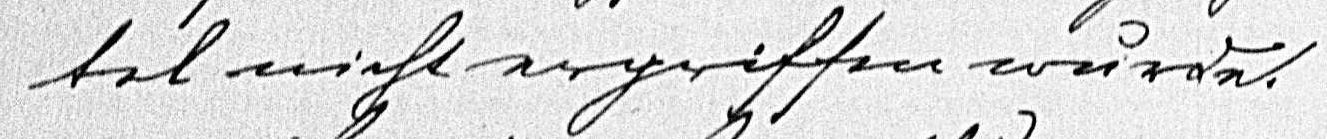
tel nicht ergriffen wurde.
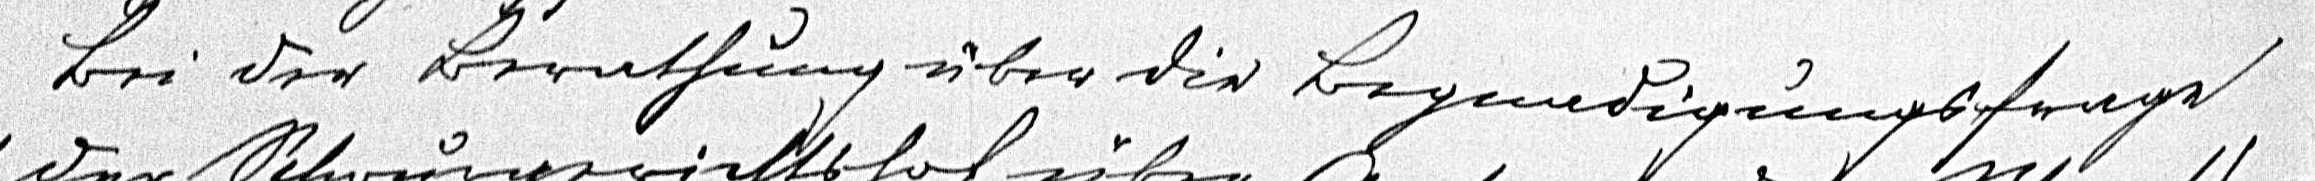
Bei der Berathung über die Begnadigungsfrage
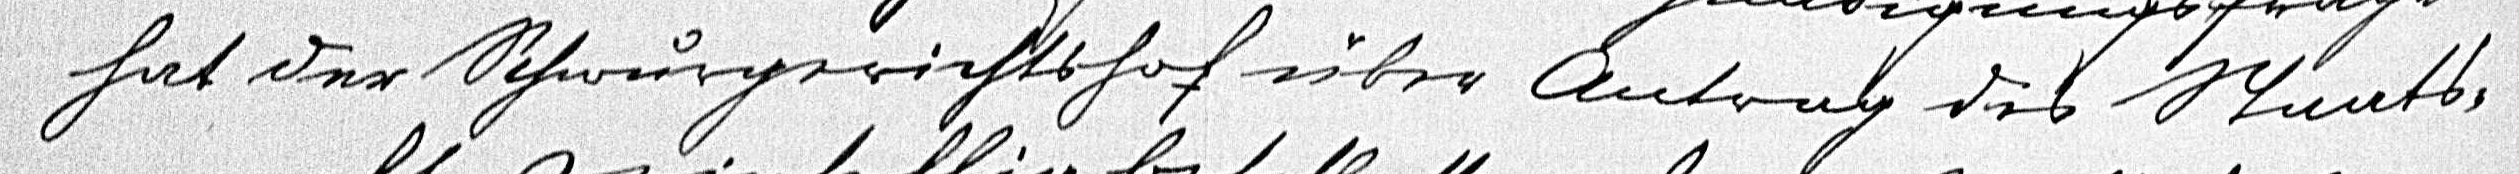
hat der Schurgerichtshof über Antrag des Staats¬
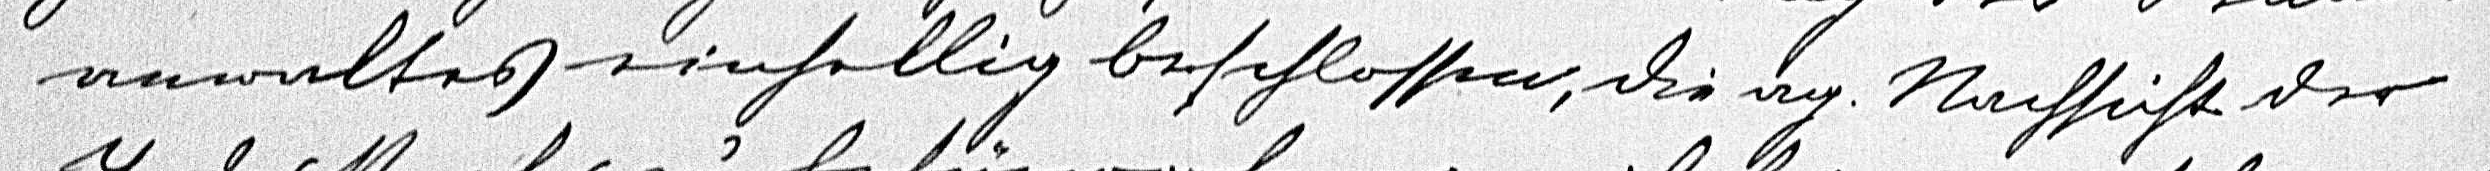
anwaltes einhellig beschlossen, die ag. Nachsicht der
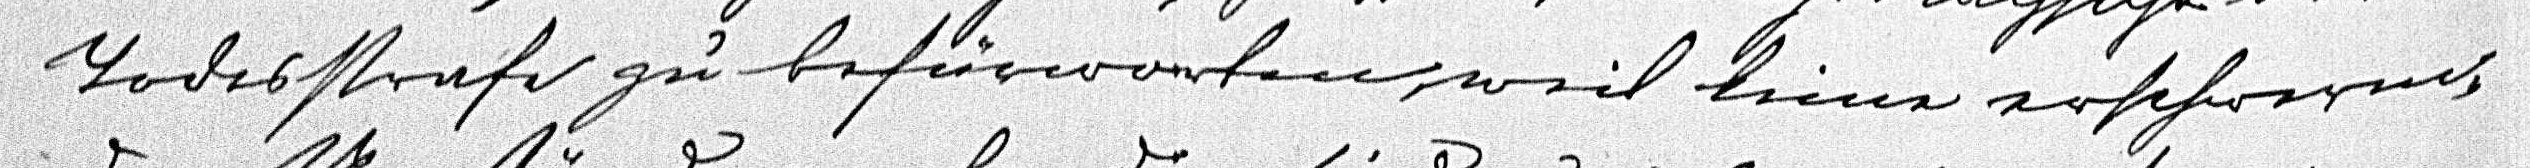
Todesstrafe zu befürworten, weil keine erschweren¬
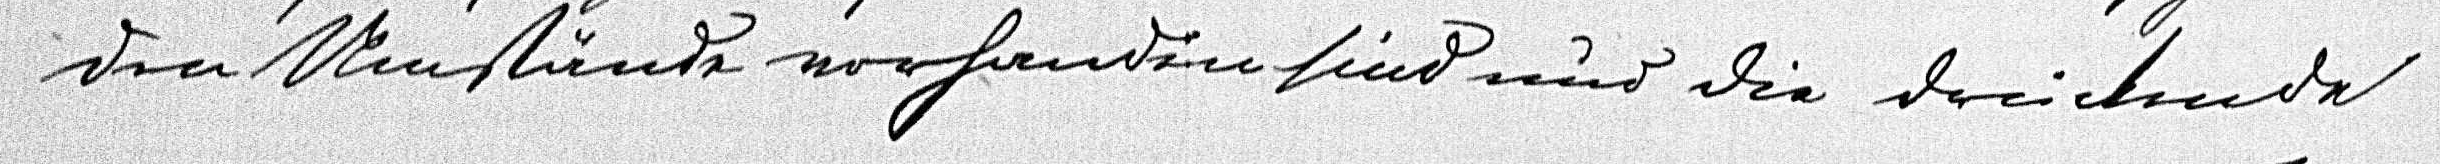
den Umstände vorhanden sind und die drückende
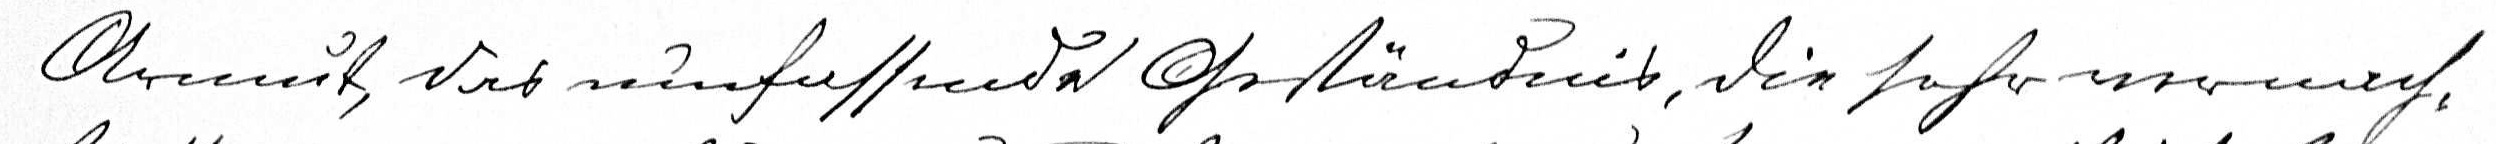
Armut, das umfassende Geständnis, die sehr vernach¬
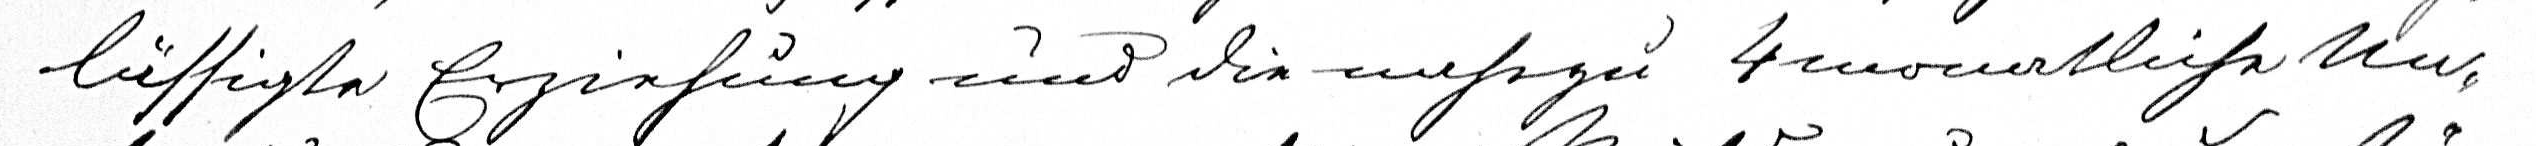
lässigte Erziehung und die nahezu 4monatliche Un¬
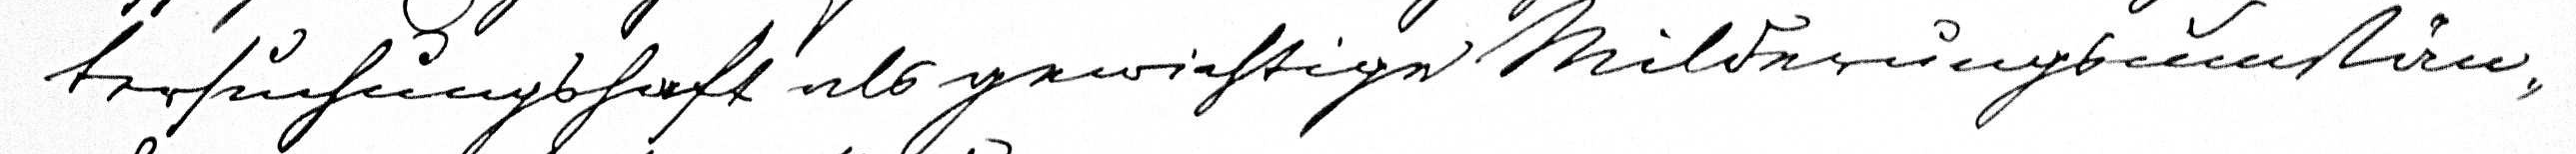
tersuchungshaft als gewichtige Milderungsumstän¬
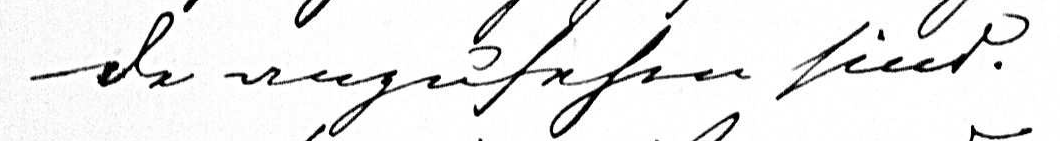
de anzusehen sind.
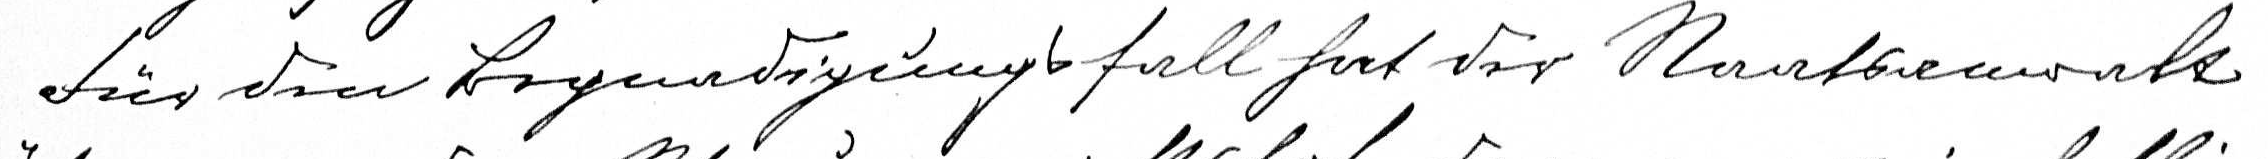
Für den Begnadigungsfall hat der Staatsanwalt
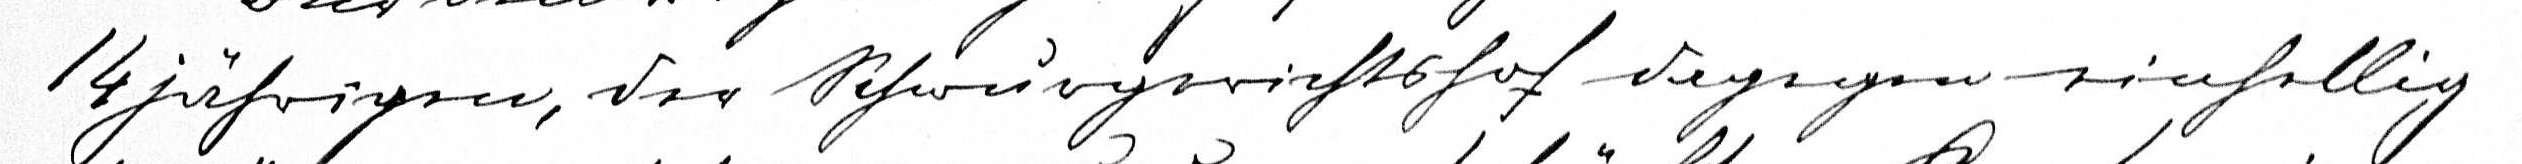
14jährigen, der Schwurgerichtshof dagegen einhellig
